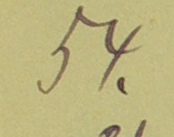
54
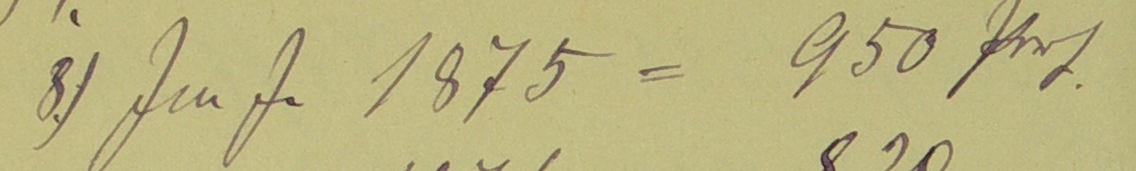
8.) 1875 = 950 Pers.*
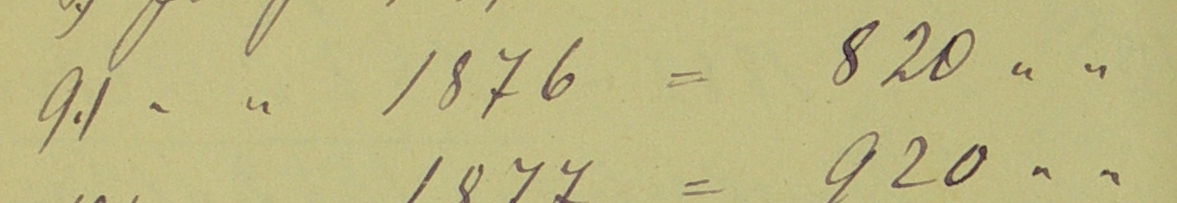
9.) 1876 = 820 *
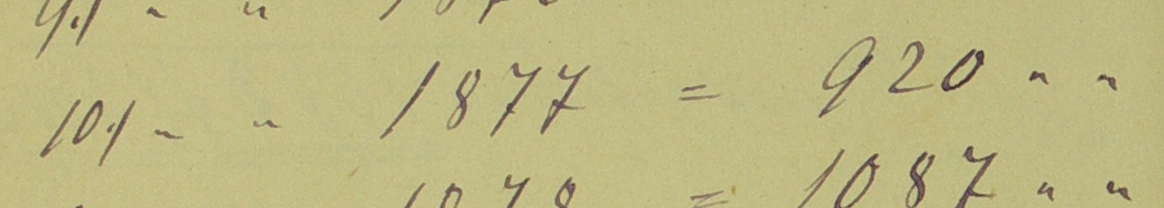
10.) 1877 = 920 *
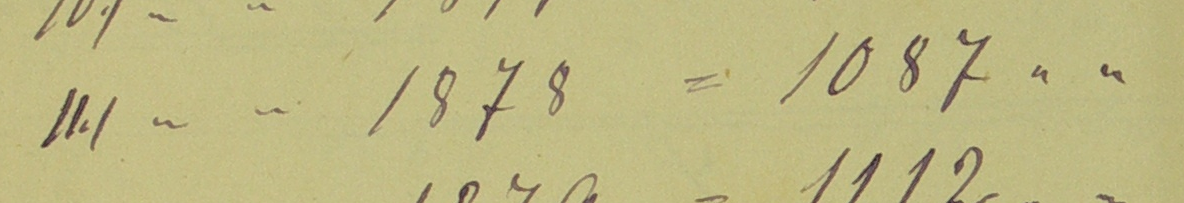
11.) 1878 = 1087 *
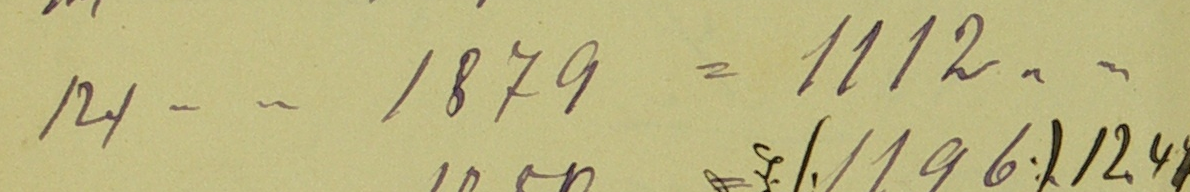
12.) 1879 = 1112 *
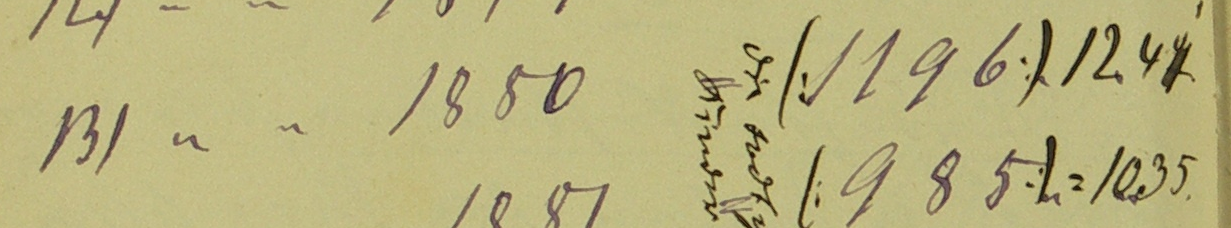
13.) 1880 = (1196) * = 1241 *
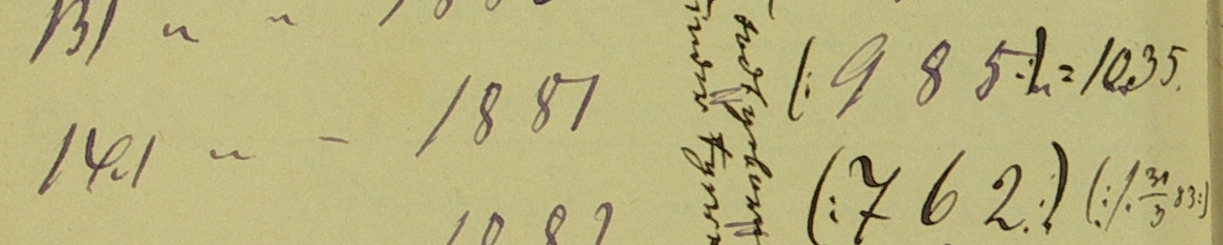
14.) 1881 = (985) * 1035 *
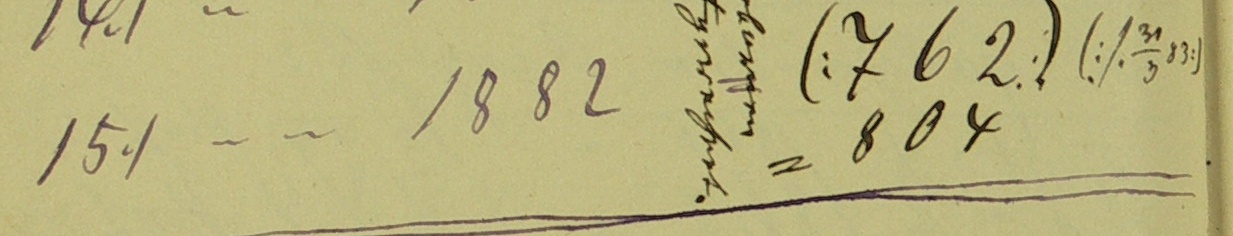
15.) 1882 = (762) * ( : /. 31/3 83 : )
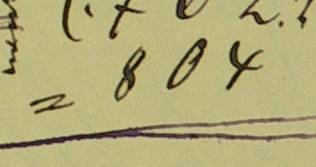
= 804 *
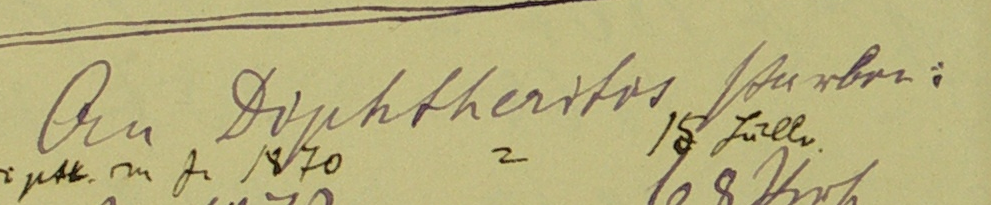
An Diphtheritis starben:
